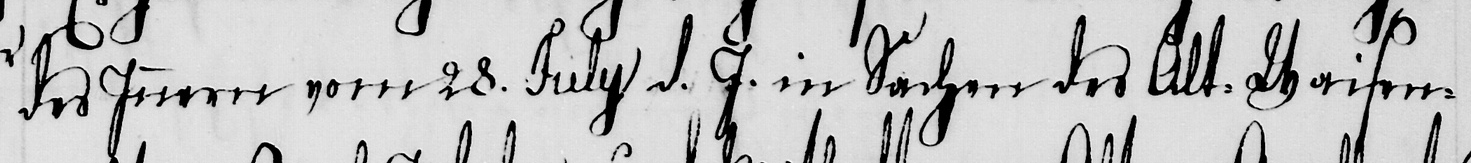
des Innern vom 28. July d. J. in Sachen des Alt-Waisen¬
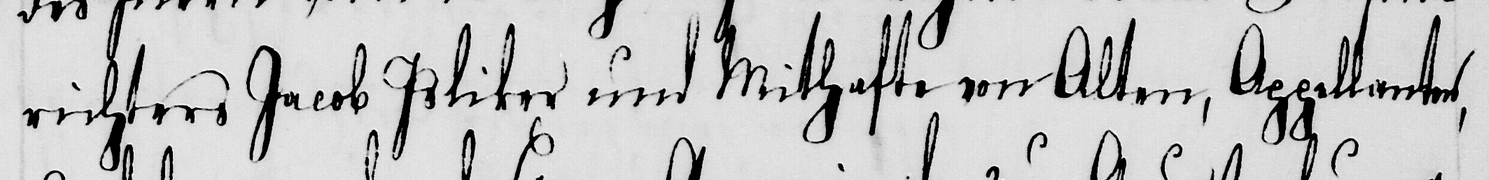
richters Jacob Isliker und Mithafte von Alten, Appellant¬
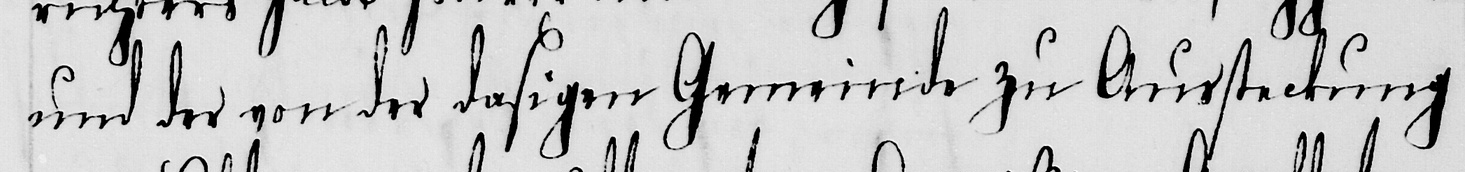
und der von der dasigen Gemeinde zu Aussteckung
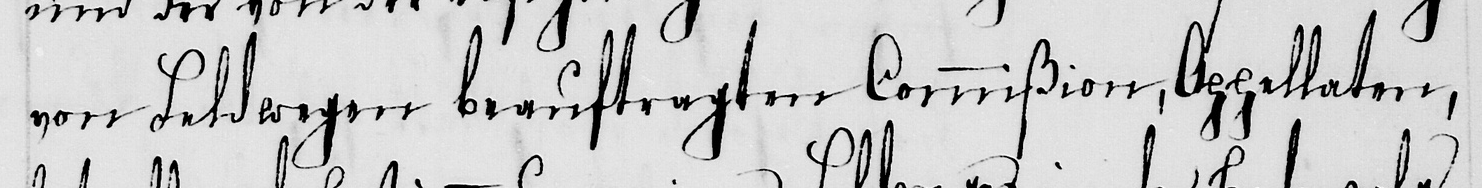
von Feldwegen beauftragten Commißion, Appellaten,
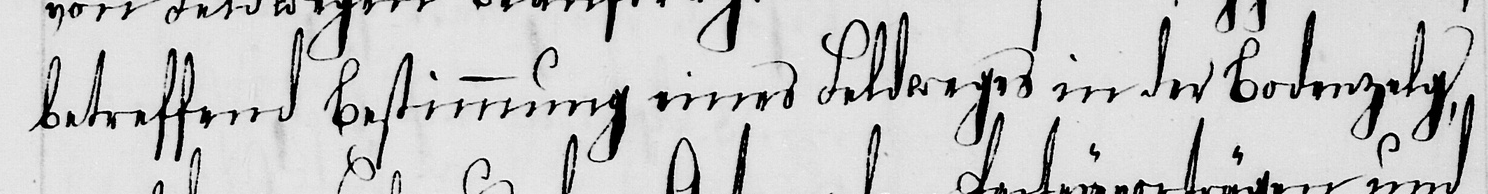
betreffend Bestimmung eines Feldweges in der Bodenzelg,
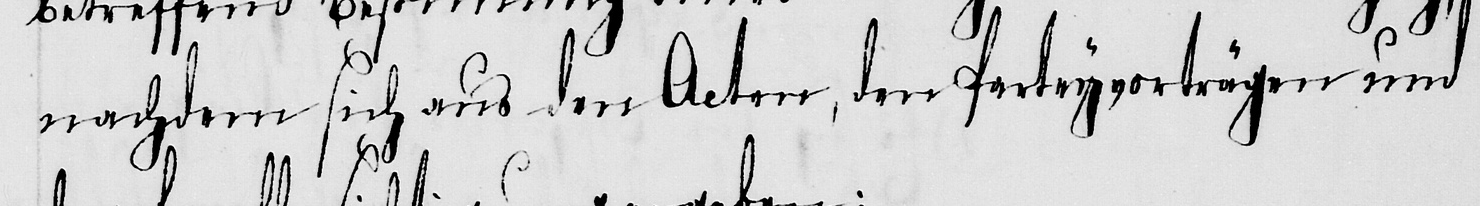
nachdem sich aus den Acten, den Parteyvorträgen und
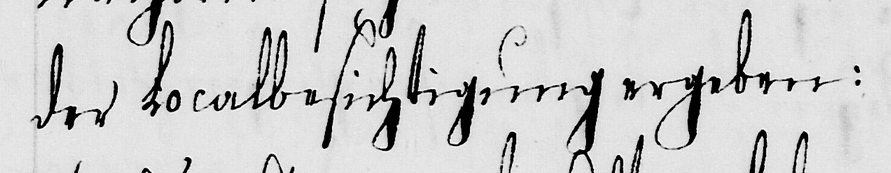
der Localbesichtigung ergeben:
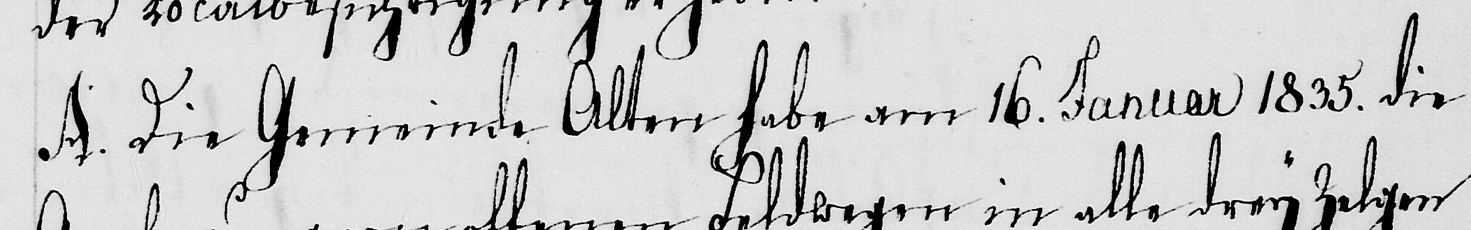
A. Die Gemeinde Alten habe am 16. Januar 1835. die
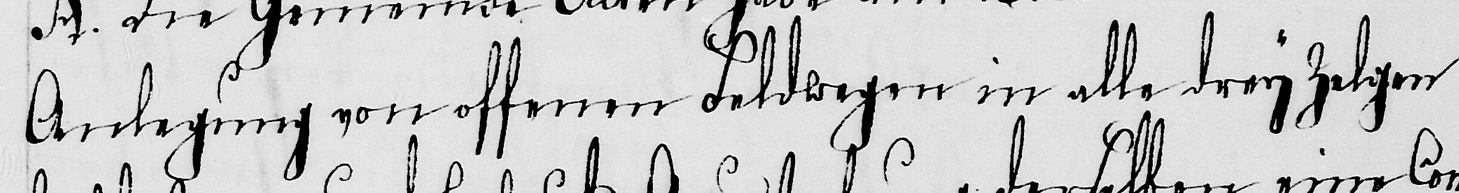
Anlegung von offenen Feldwegen in alle drey Zelgen
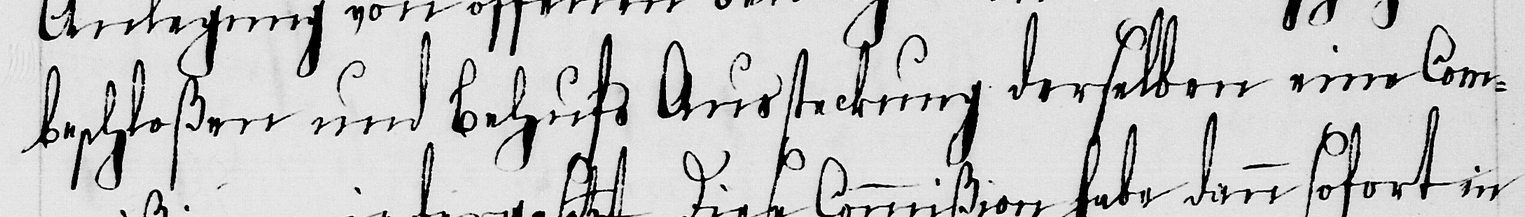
beschloßen und Behufs Aussteckung derselben eine Com¬
